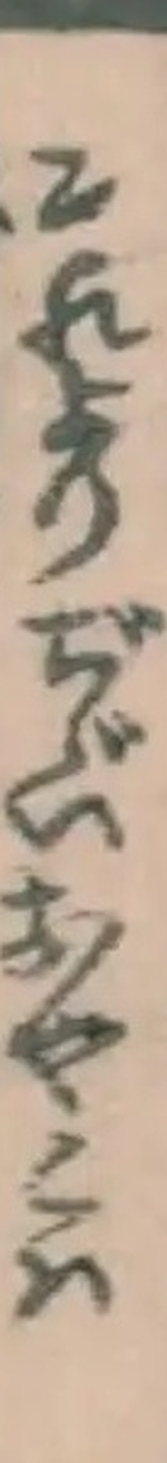これよりぢゞいおやこは
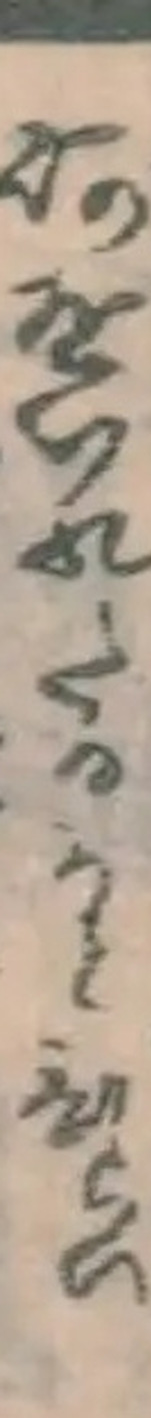何をいれたるかとひらい
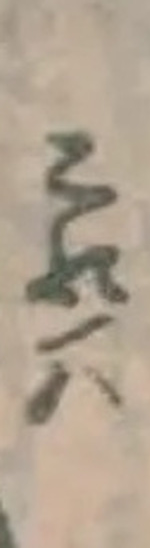これは
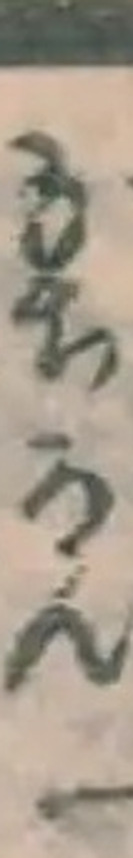もちろん
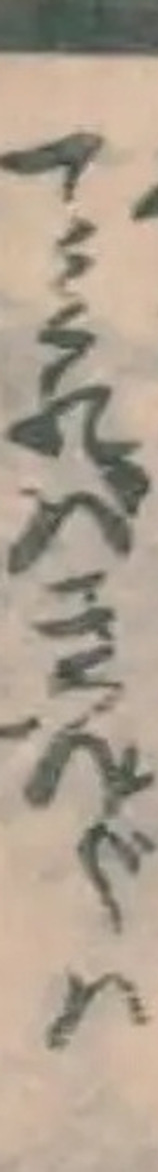てみればきん〴〵は
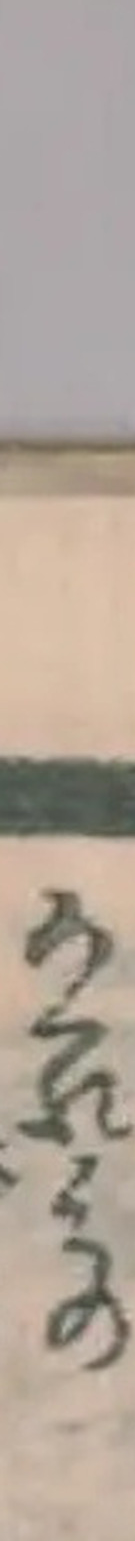かくれみの
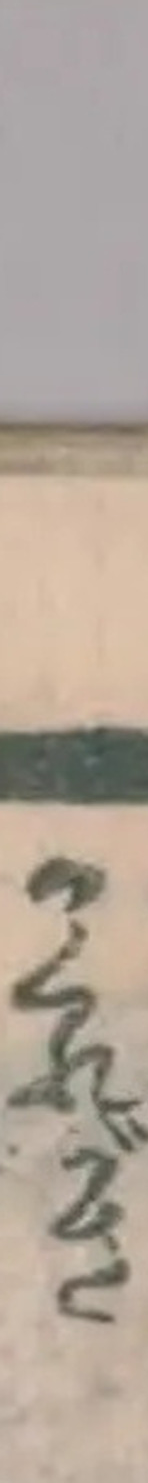かくれみの
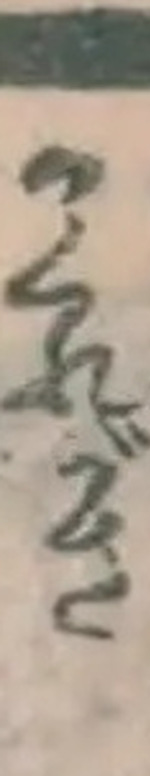かくれみの
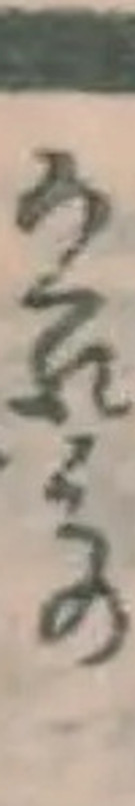かくれみの
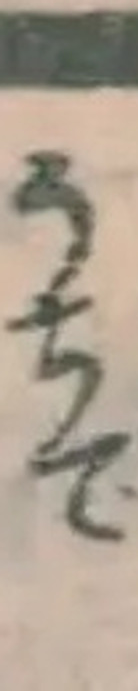うちで
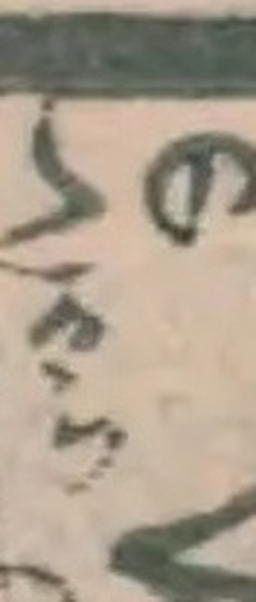たから
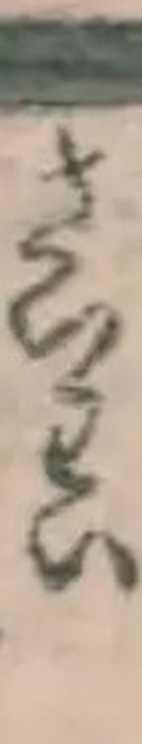さいわい
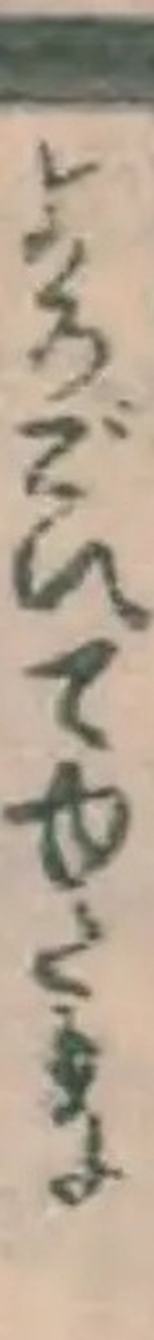よろこひてゆたかに
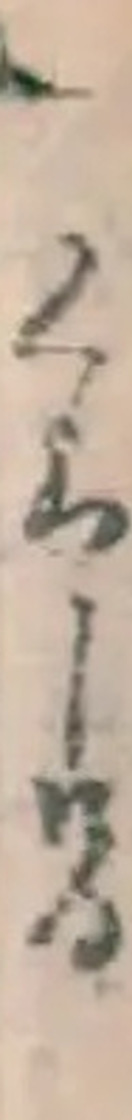くらしける
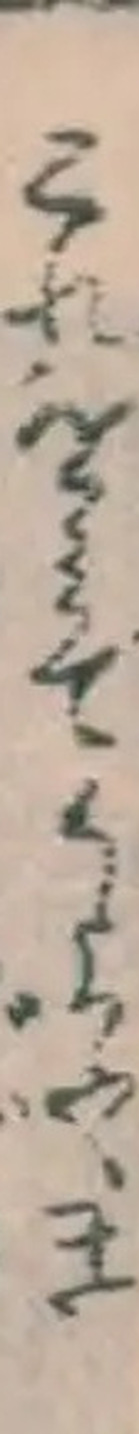これをみてうらやま
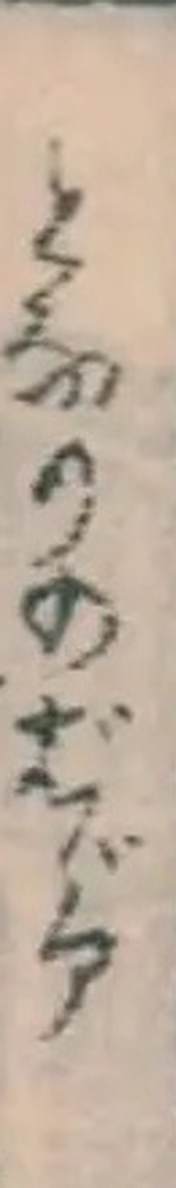となりのばゞあ
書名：舌切雀
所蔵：国立国会図書館 National Diet Library, JAPAN
